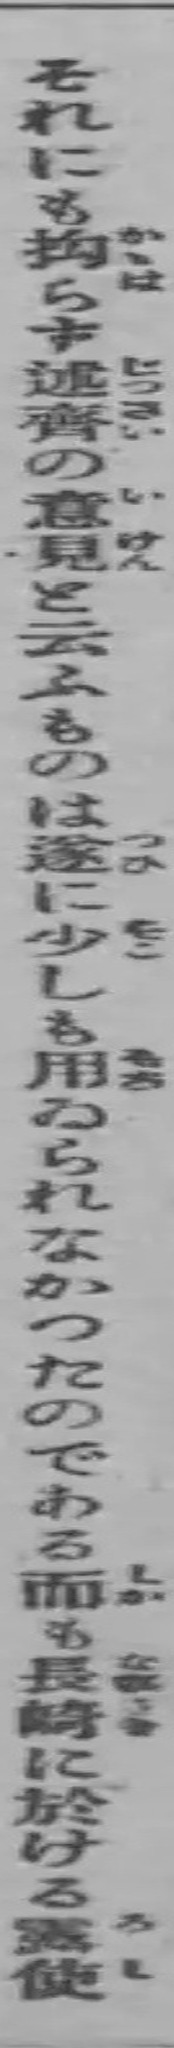それにも抅らず述斉の意見と云ふものは遂に少しも用ゐられなかつたのである而も長崎に於ける露使
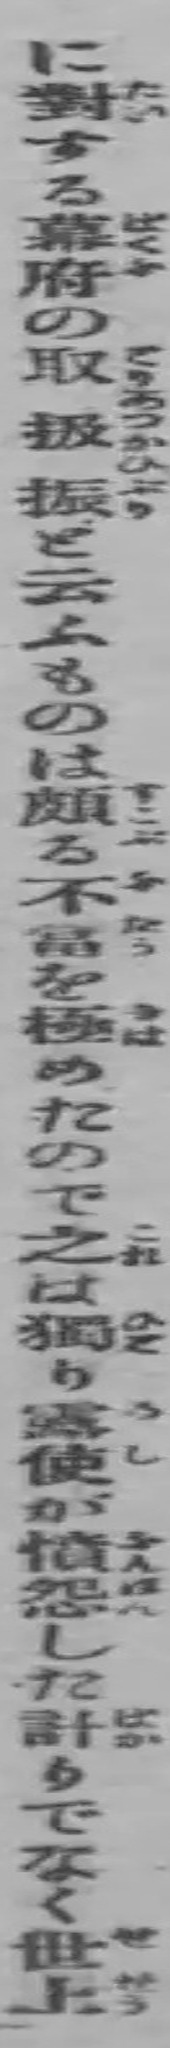に対する幕府の取扱振と云ふものは頗る不当を極めたので之は独り露使が憤怨した計りでなく世上
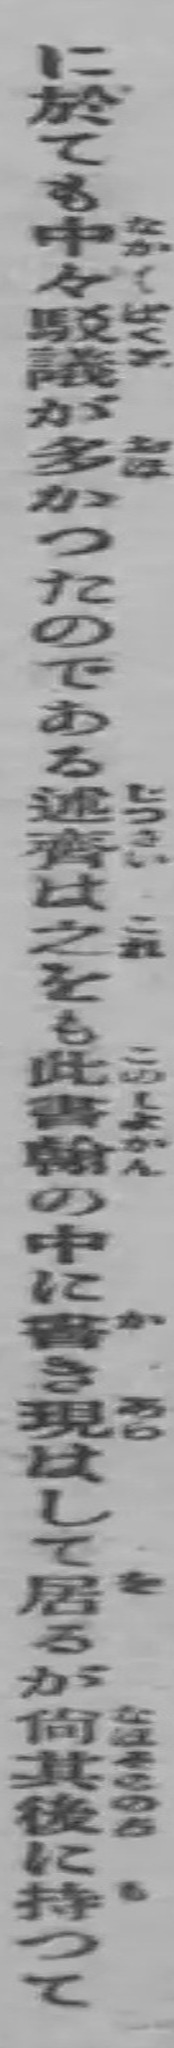に於ても中々駁議が多かつたのである述斉は之も此書翰の中に書き現はして居るが尚其後に持つて
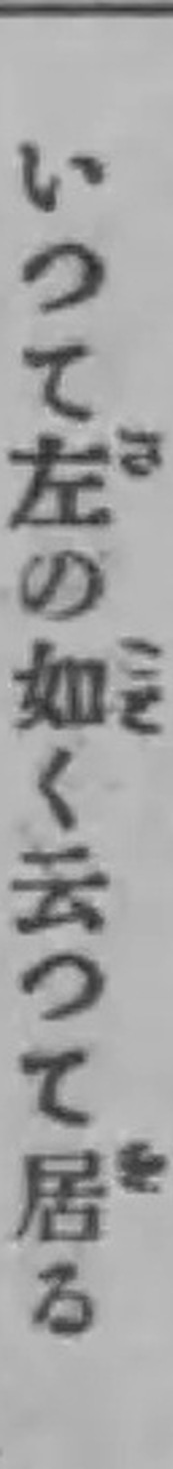いつて左の如く云つて居る
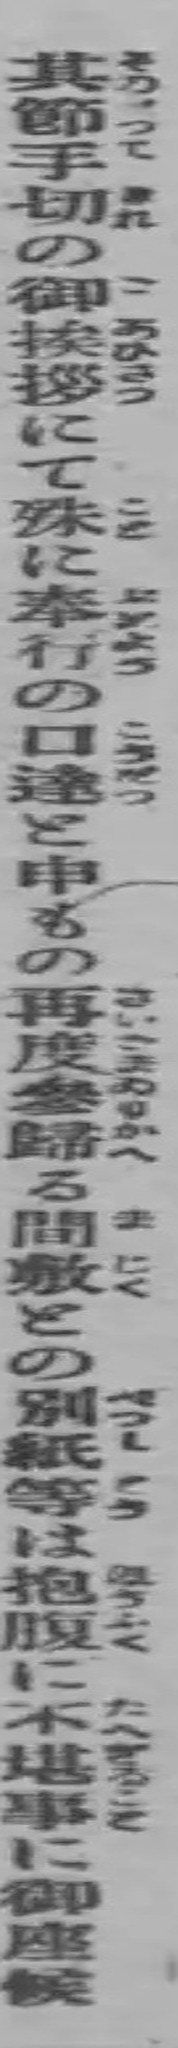其節手切の御挨拶にて殊に奉行の口達と申もの再度参帰る間敷との別紙等は抱腹に不堪事に御座候
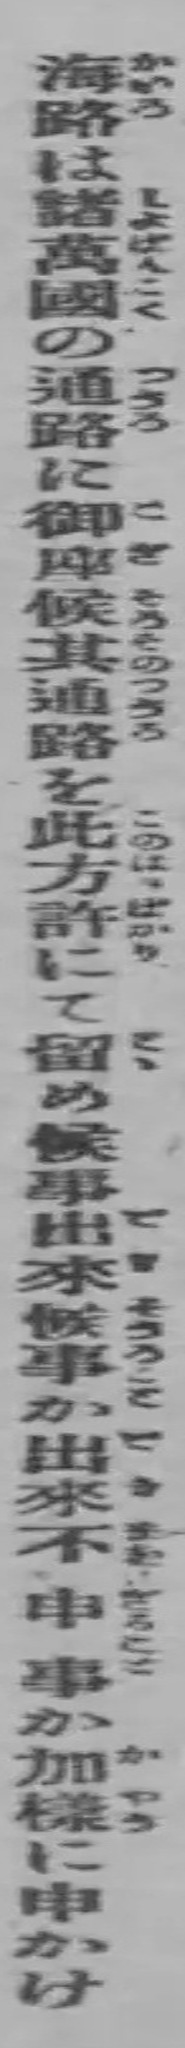海路は諸万国の通路に御座候其通路を此方許にて留め候事出来候事が出来不申事か加様に申かけ
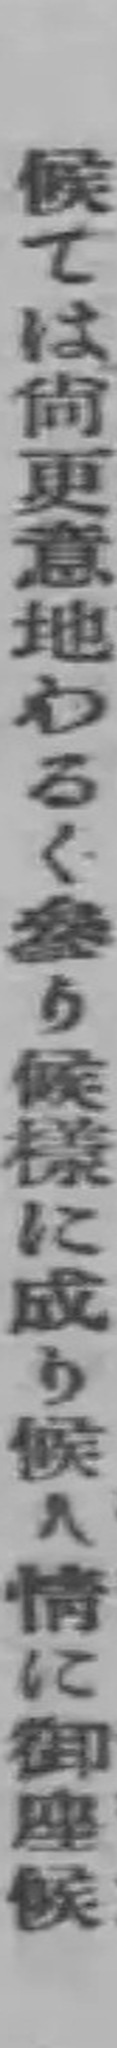候ては尚更意地わるく参り候様に成り候人情に御座候
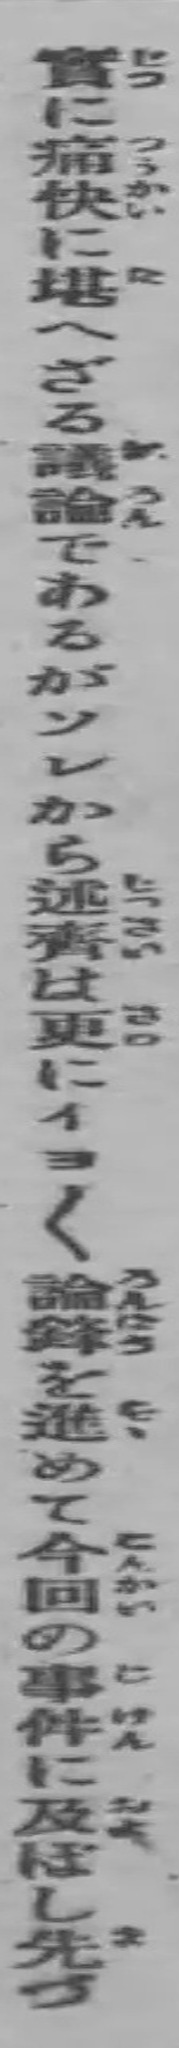実に痛快に堪へざる議論であるがソレから述斉は更にイヨ〳〵論鋒を進めて今回の事件に及ぼし先づ
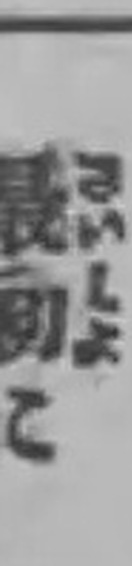最初に
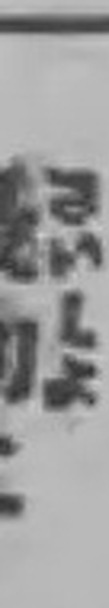最初に
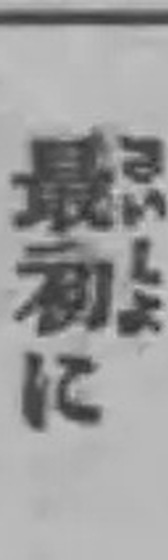最初に
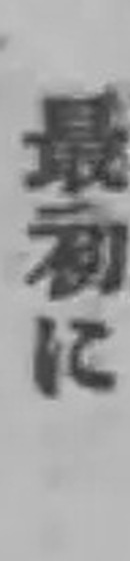最初に
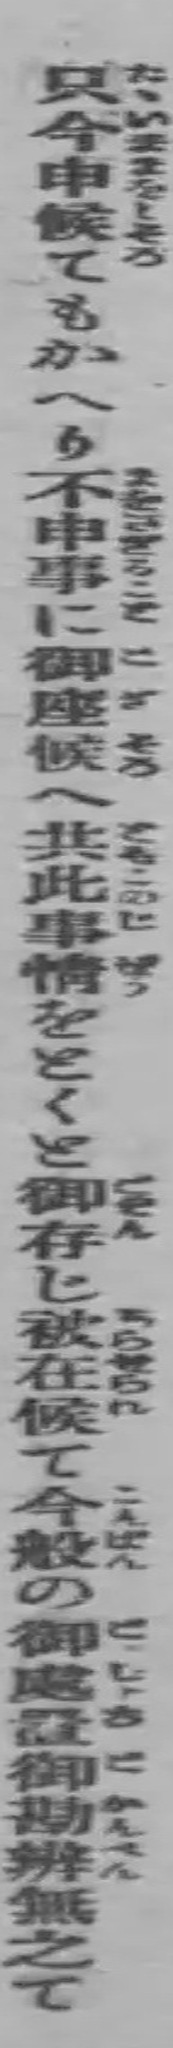只今申候てもかへり不申事に御座候へ共此事情をとくと御存じ被在候て今般の御処置御勘弁無之て
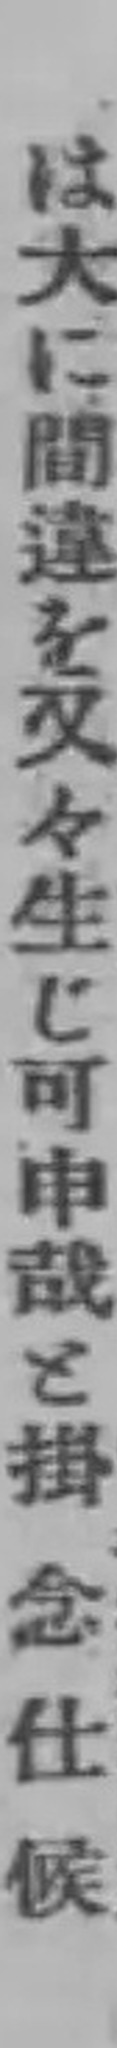は大に間違を又々生じ可申哉と掛念仕候
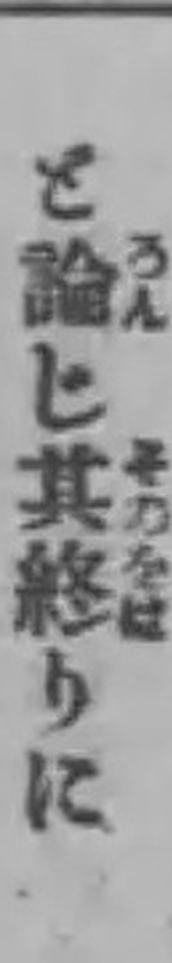と論じ其終りに
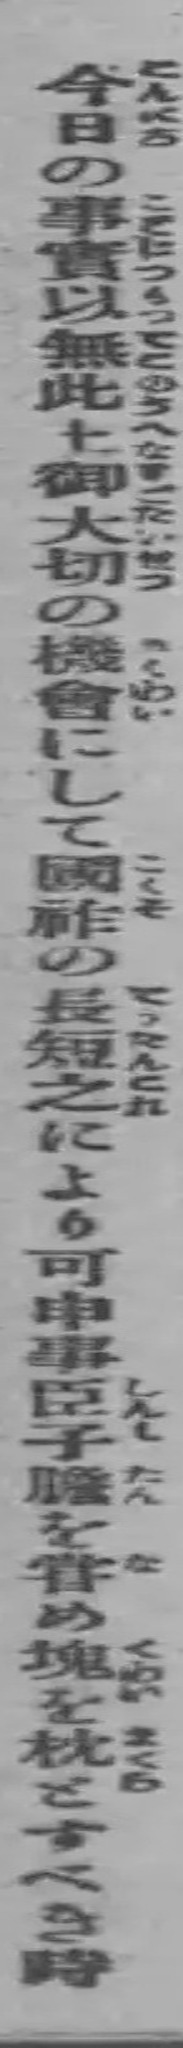今日の事実以無此上御大切の機会にして国祚の長短之により可申事臣子膽を甞め塊を枕とすべき時
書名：豊橋市史談
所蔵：国立国会図書館 National Diet Library, JAPAN
